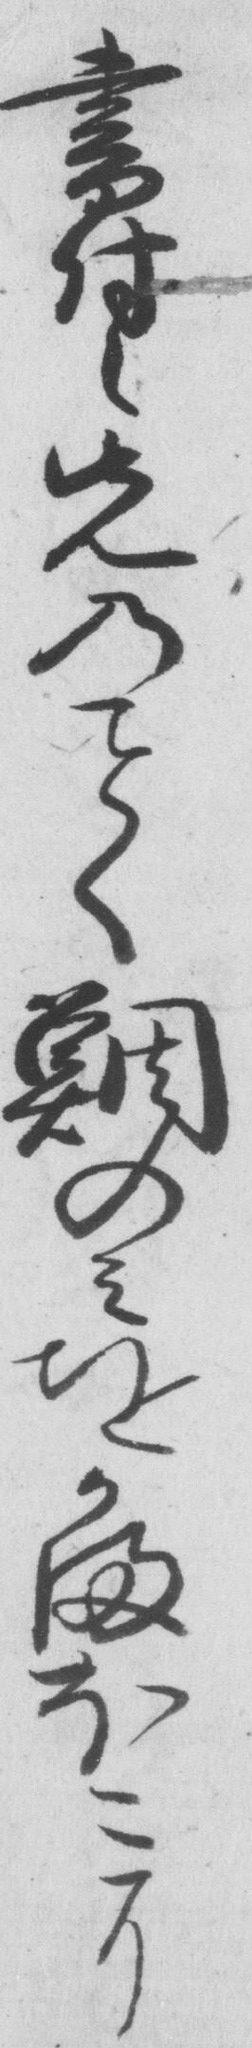書付候先のことく鯛のみをかまほこに
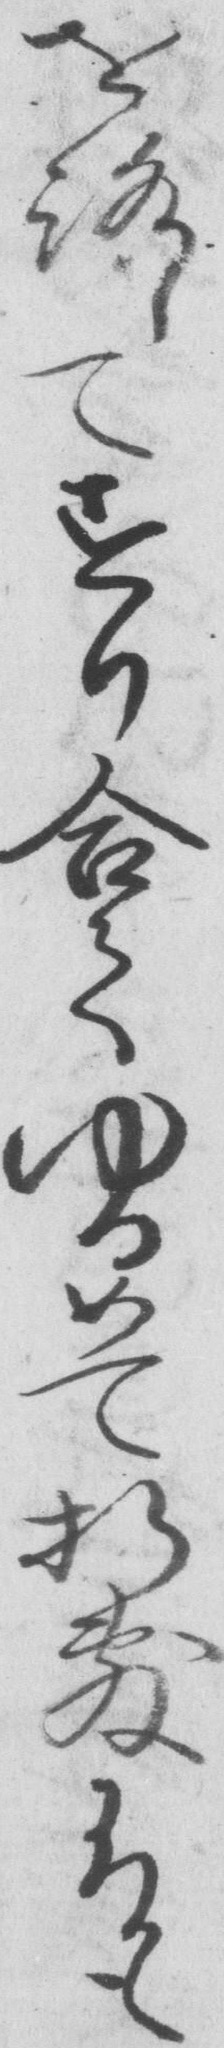をろしてすり合てゆるめて折敷にても
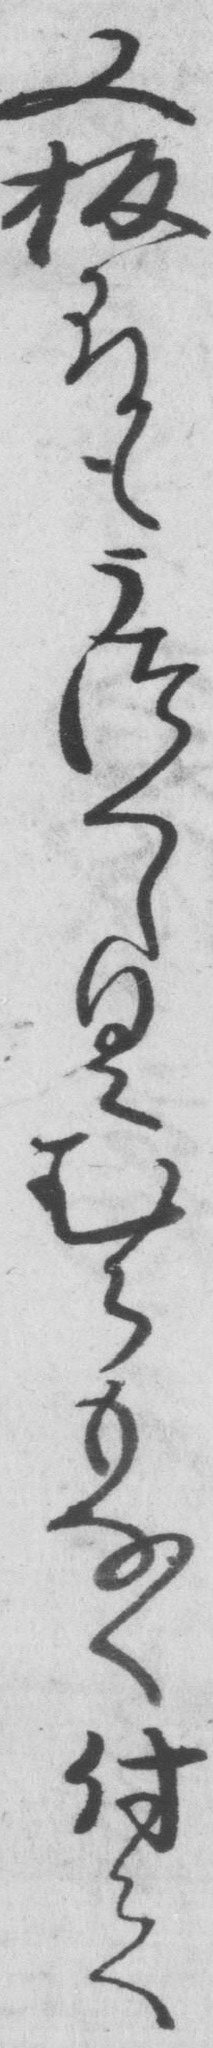又板にてもうつくしくむらもなく付て
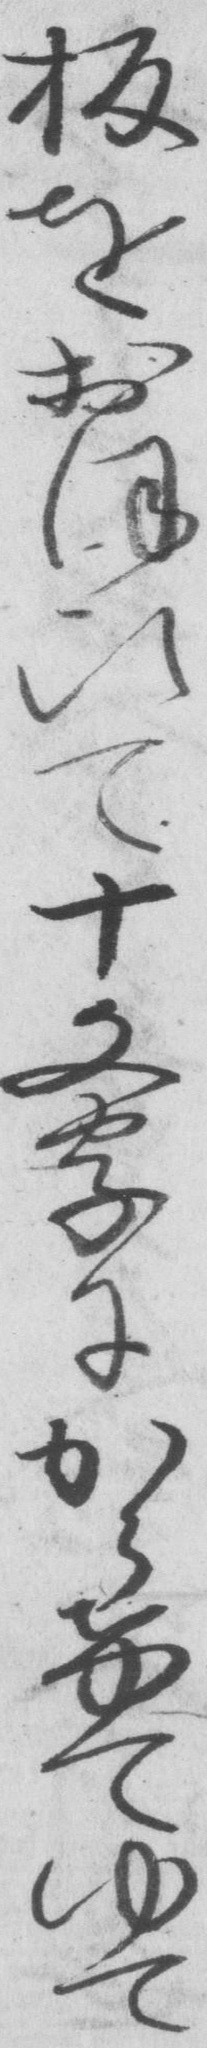板をおほひて十文字にからけてゆて
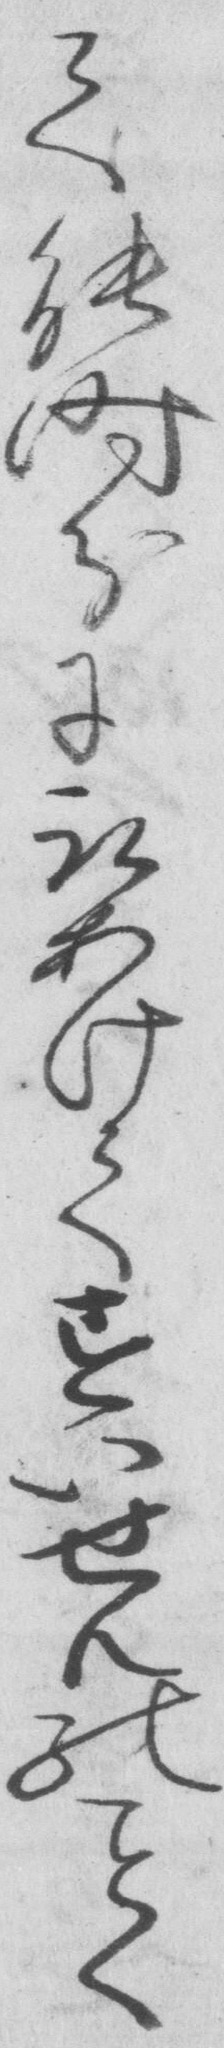て能時分に取あけてすいせんのことく
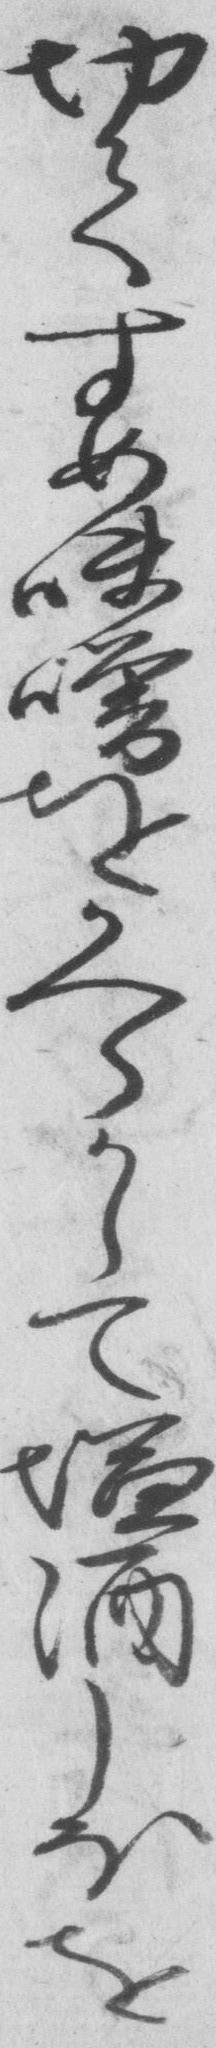切てすめ味噌をかへらかして塩酒しほを
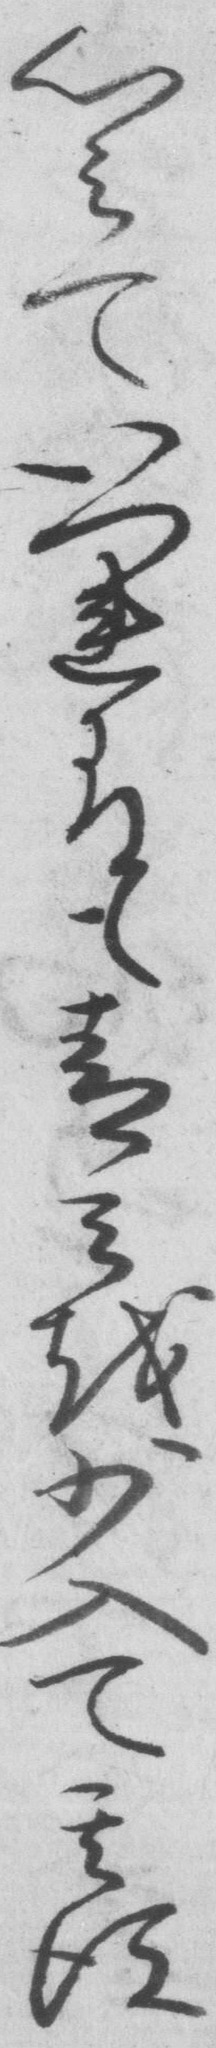心みていつれにてもすみを少入て其後
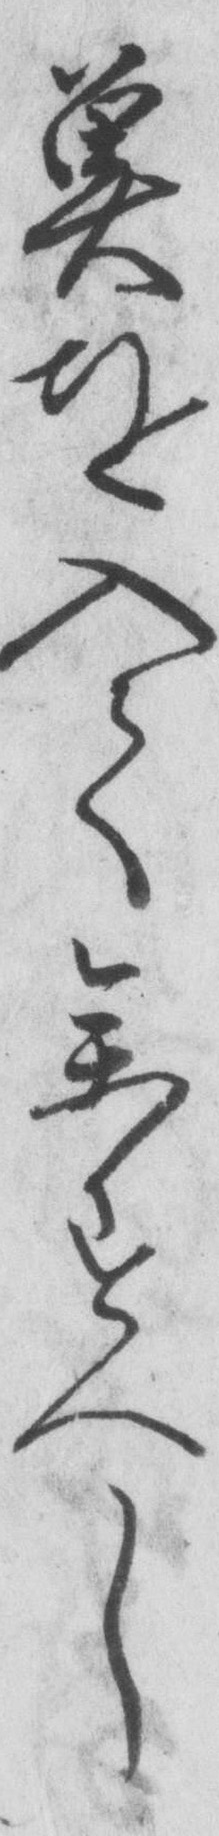魚を入て参すへし
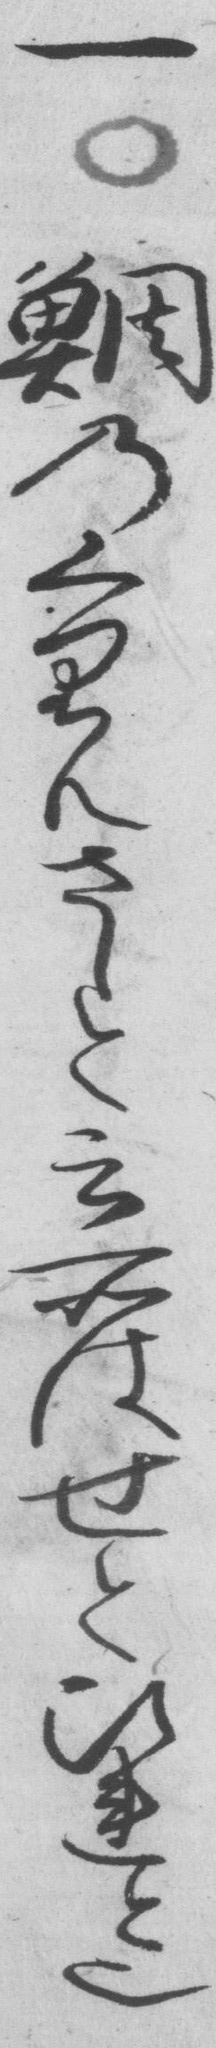一○鯛のくわんさしと言所はせとひれと也

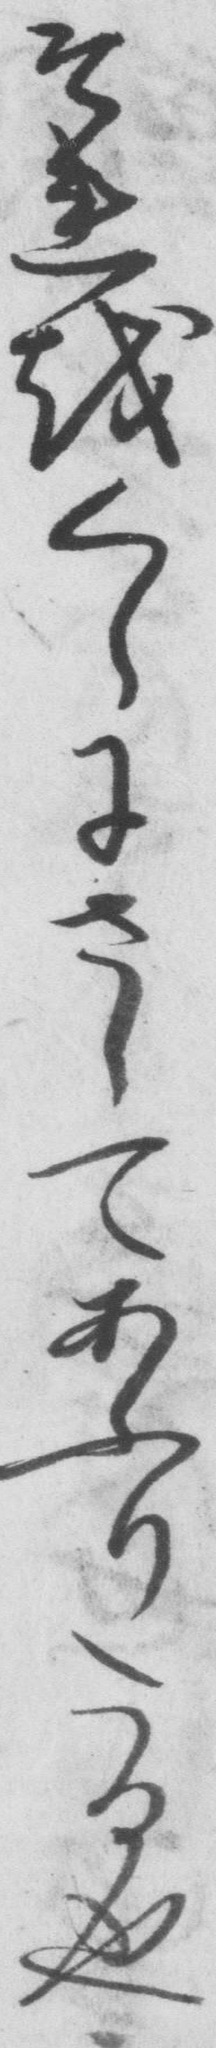それをくしにさしてあふりたる也
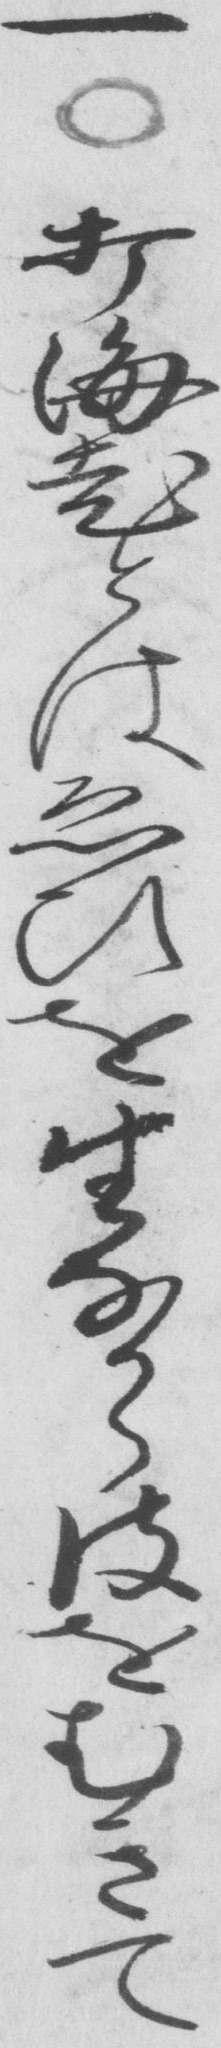一○打海老とはゑひを生なから皮をむきて
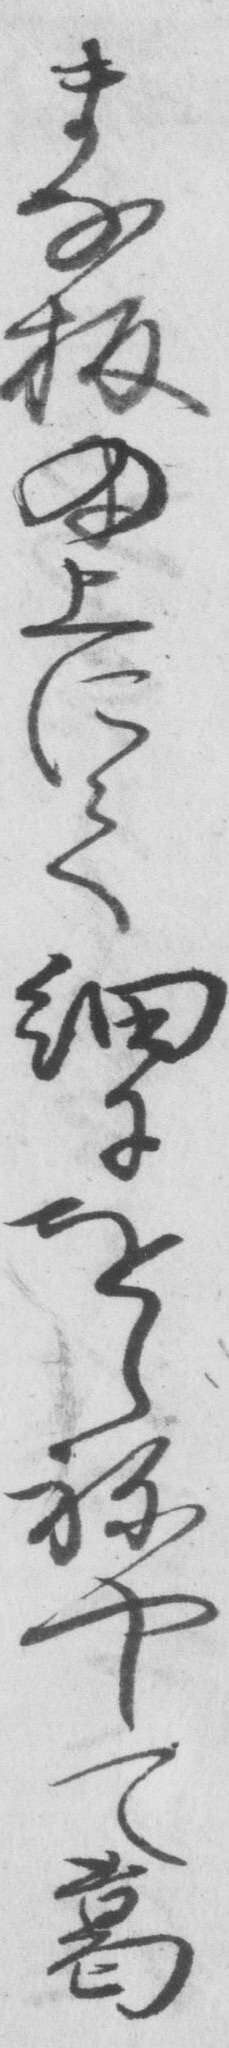まな板の上にて細にをしねやして葛
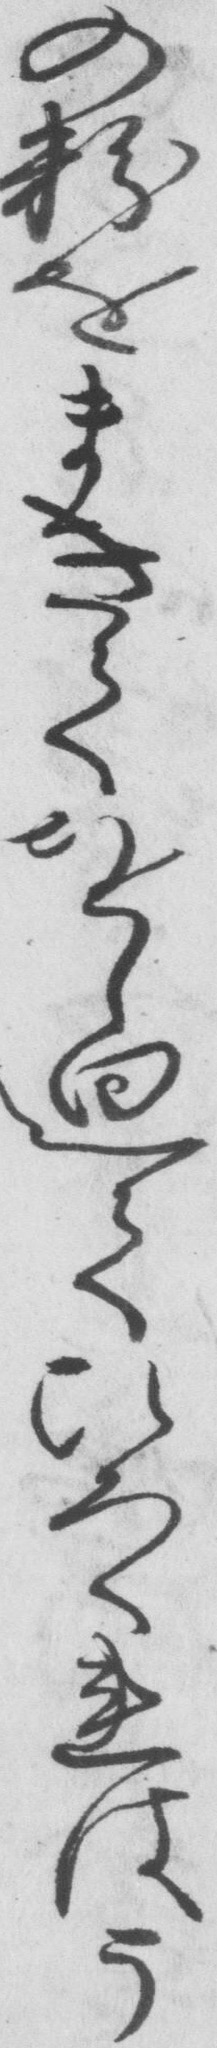の粉をまきてをし廻てひろくれはう
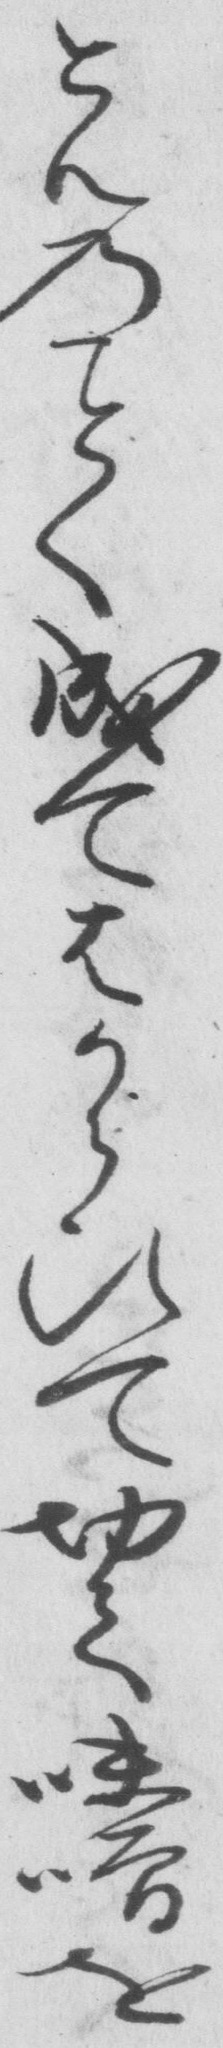とんのことく成てはからひて切て味噌を
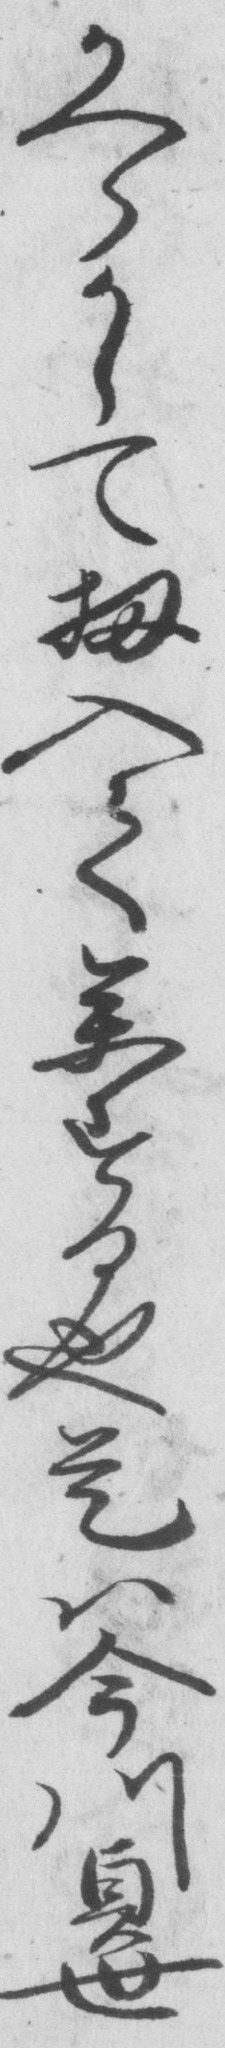かへらかして扨入て参する也是は今川貞世
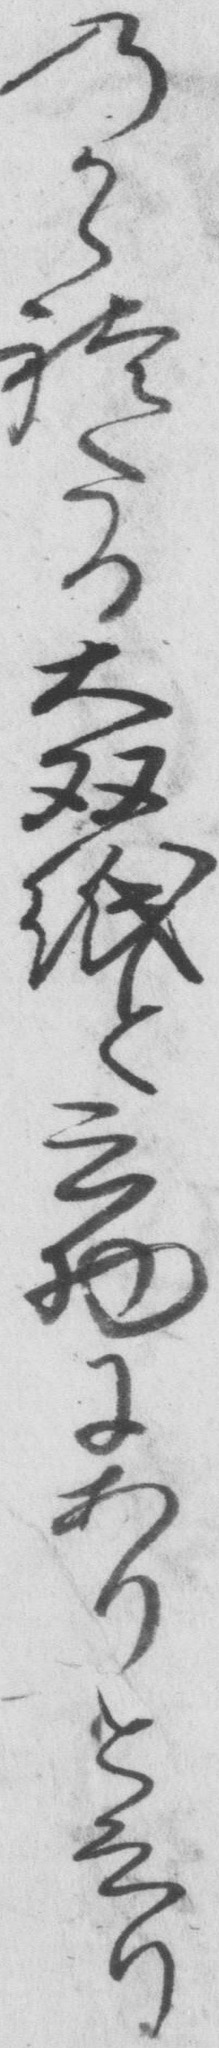のかゝれたる大双紙と云物にありと云り
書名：料理次第
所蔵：大阪府立大学学術情報センター 国文学研究資料館
